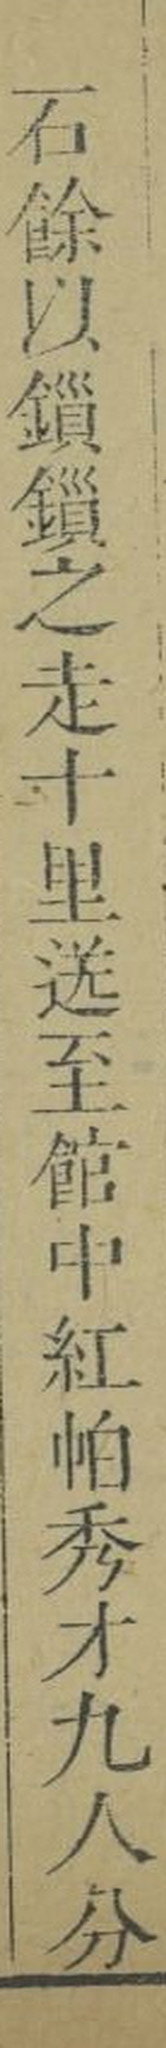石餘以鎻鎻之走十里送至館中紅帕秀才九人分
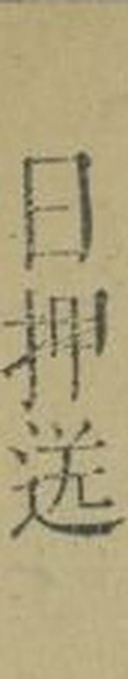日押送
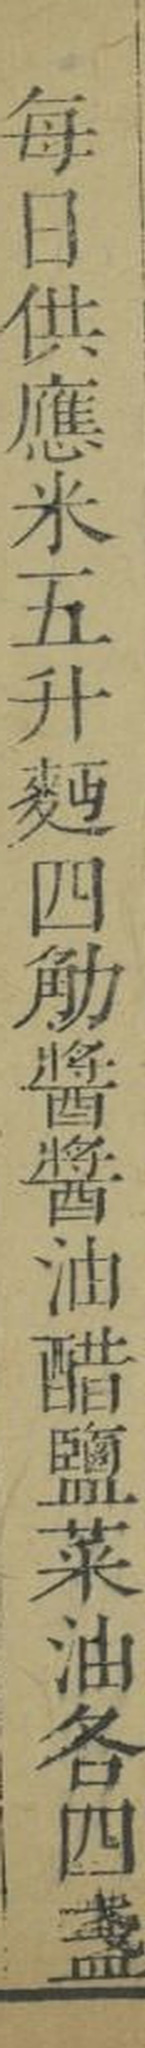每日供應米五升麪四觔醬醬油醋鹽菜油各四盞
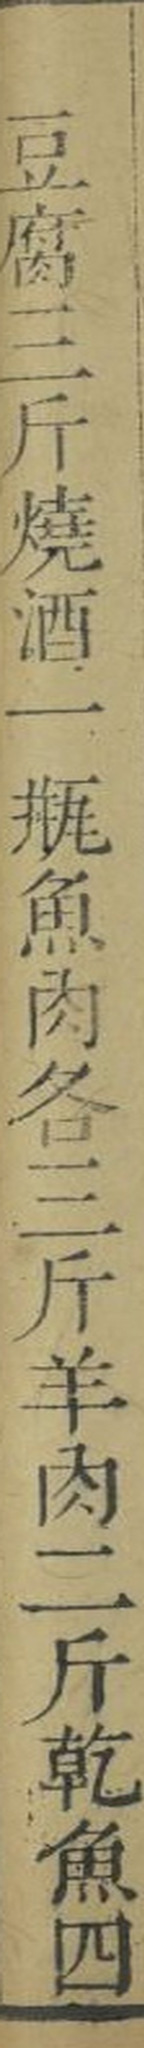豆腐三斤燒酒一甁魚肉各三斤羊肉二斤乾魚四
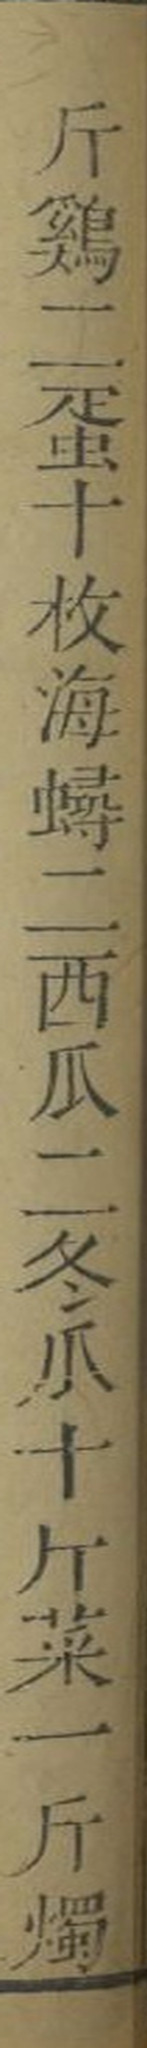斤鷄二蛋十枚海蟳二西瓜二冬瓜十斤菜一斤燭
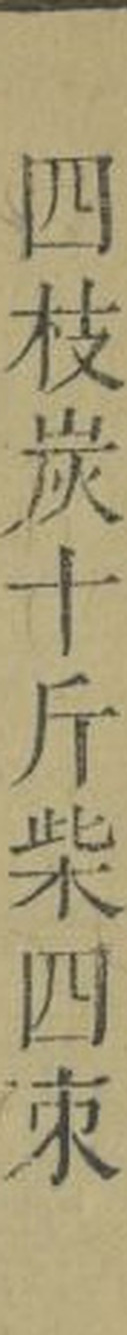四枝炭十斤柴四束
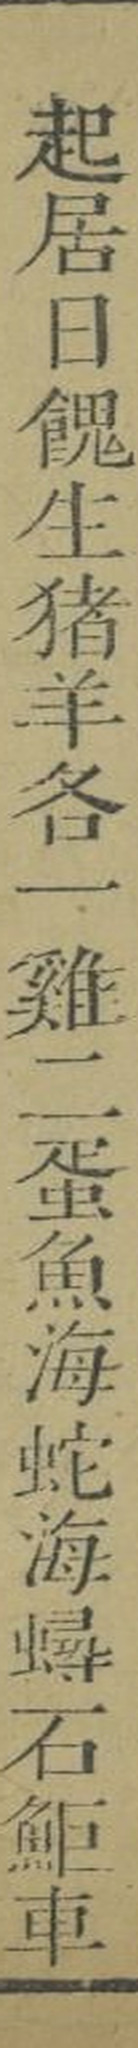起居日餽生猪羊各一雞二蛋魚海蛇海蟳石鮔車
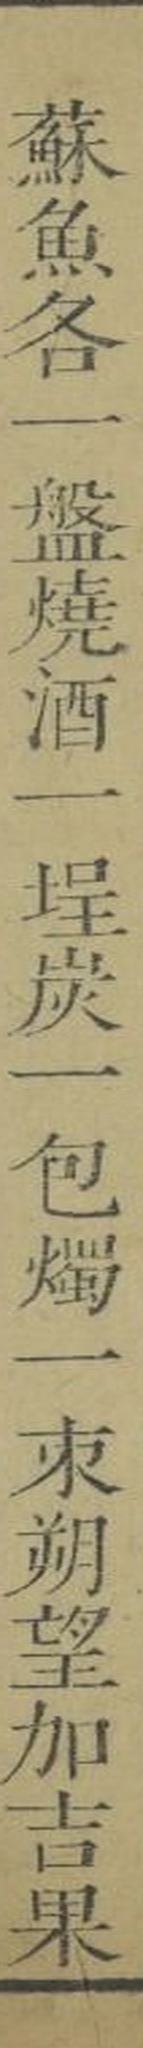蘇魚各一盤燒酒一埕炭一包燭一束朔望加吉果
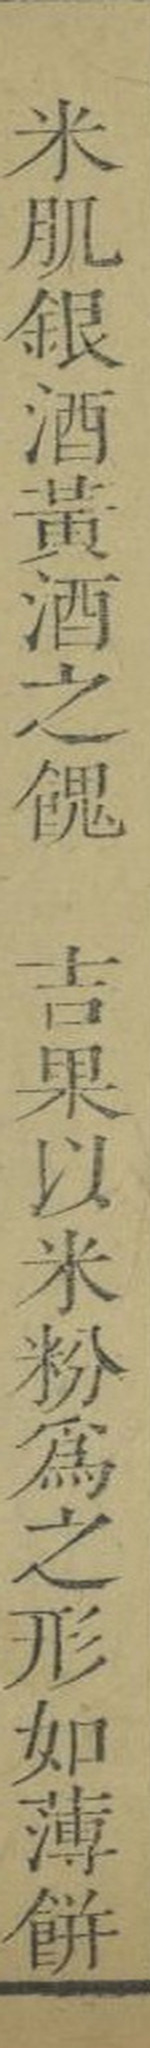米肌銀酒黃酒之餽吉果以米粉爲之形如薄餅
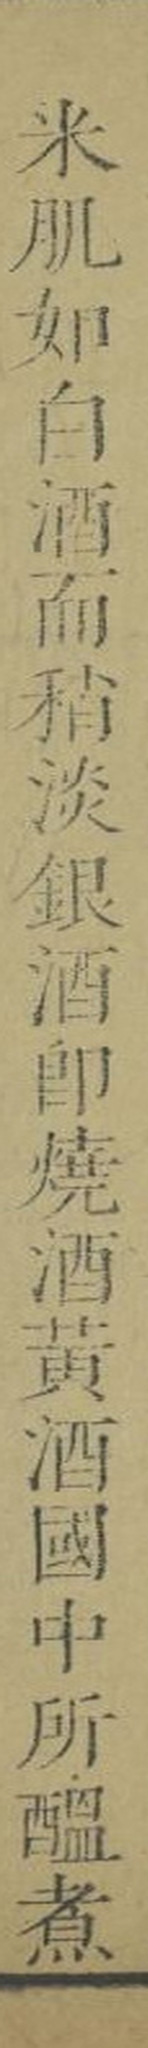米肌如白酒而稍淡銀酒卽燒酒黃酒國中所醞煮
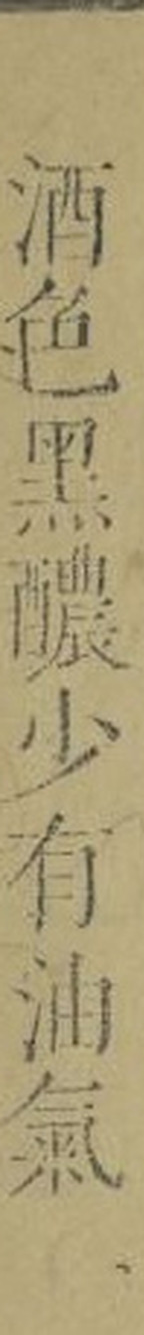酒色黑醲少有油氣
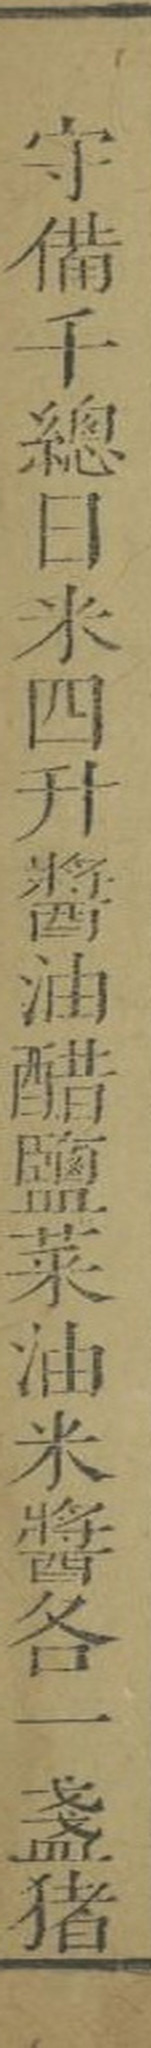守備千總日米四升醬油醋鹽菜油米醬各一盞猪

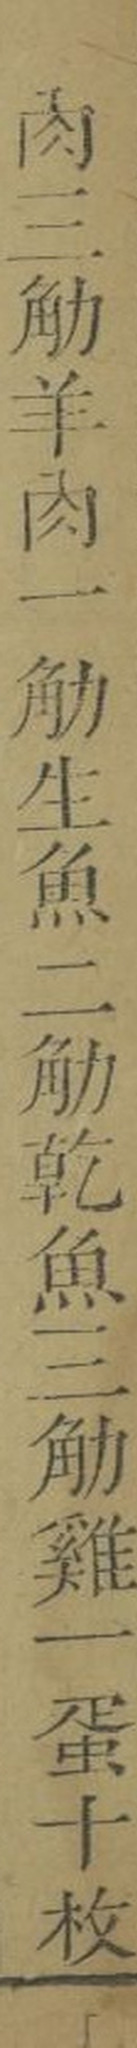肉三觔羊肉一觔生魚二觔乾魚三觔雞一蛋十枚
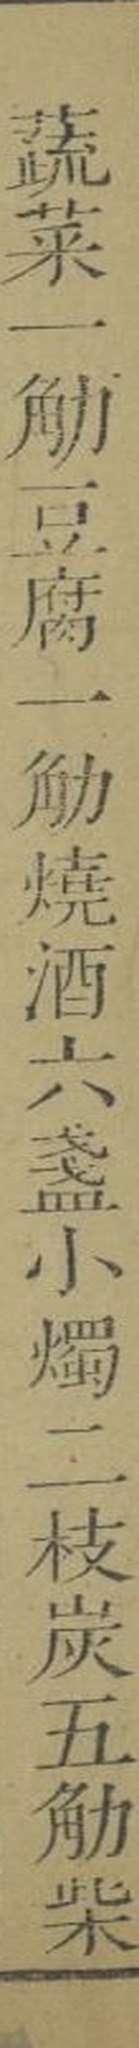蔬菜一觔豆腐一觔燒酒六盞小燭二枝炭五觔柴
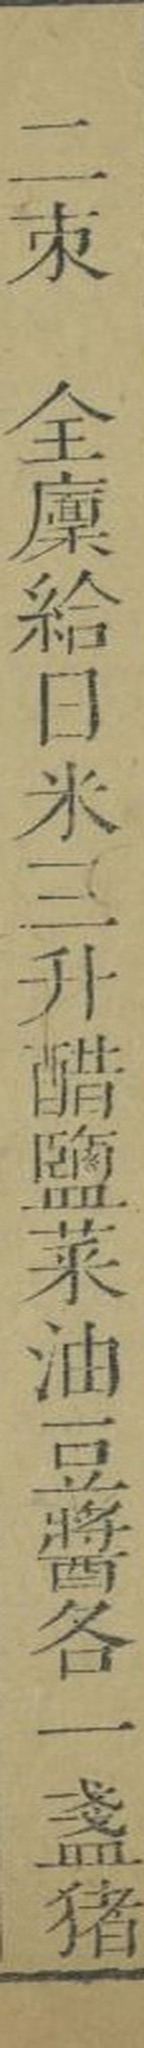二束全廩給日米三升醋鹽菜油豆醬各一盞猪
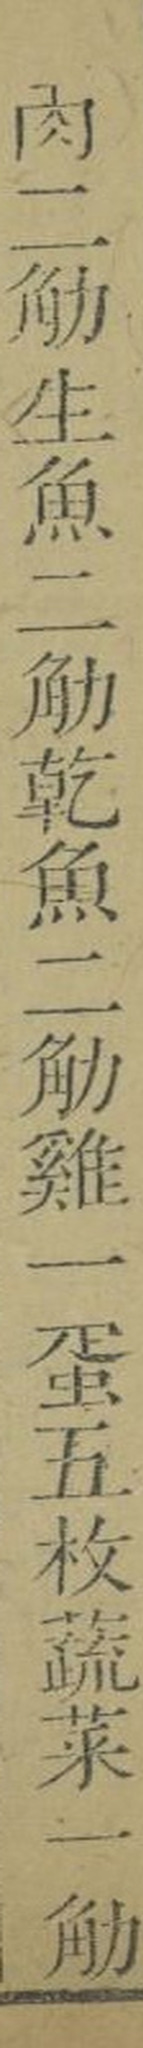肉二觔生魚二觔乾魚二觔雞一蛋五枚蔬菜一觔
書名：中山伝信録 巻二
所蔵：University of the Ryukyus Library
